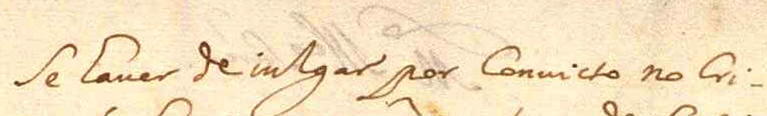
se hauer de iulgar por Conuicto no Cri
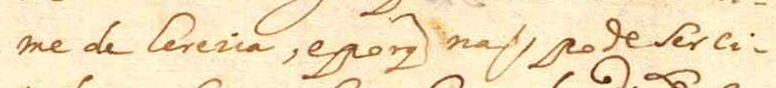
me de herezia, e porq̄ naõ pode ser ci
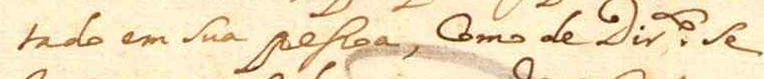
tado em sua pessoa, Como de Dir.to se
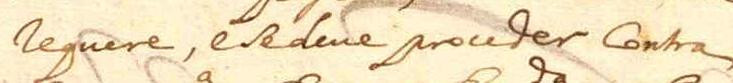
Requere, e se deue proceder Contra
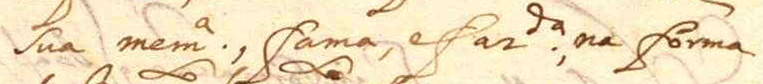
sua mema., fama, e faz.da, na forma
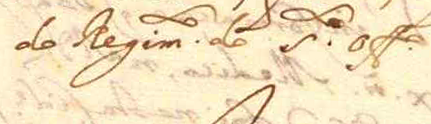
do Regim.to do s.to off.o
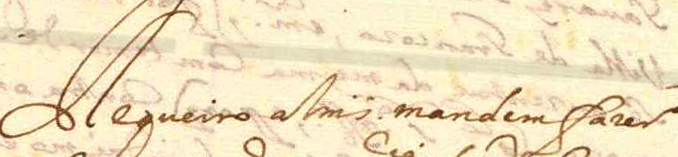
Requeiro a Vms mandem fazer
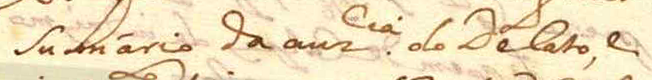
Sumário da auz.cia do Delato, e
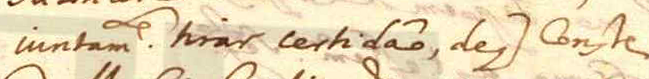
iuntam.te tirar certidaõ, de q̄ Conste
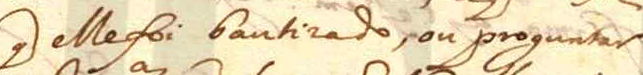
q̄ elle foi bautizado, ou proguntar
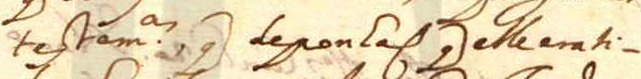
testem.as, q̄ deponhaꝭ q̄ elle era ti
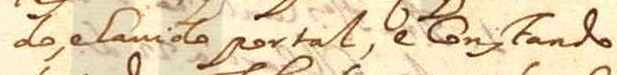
do, e hauido por tal, e Constando
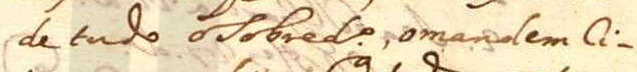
de tudo o sobred.o, o mandem Ci
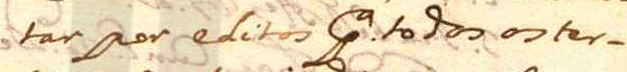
tar por editos p.a todos os ter
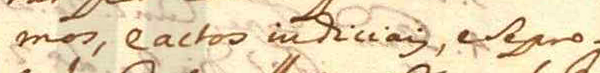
mos, e actos iudiciais, e se pro
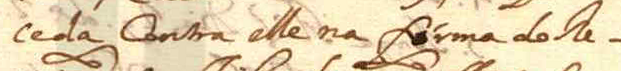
ceda Contra elle na forma do Re
